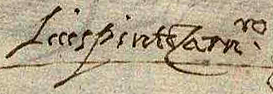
Luis pinto Carn.ro
